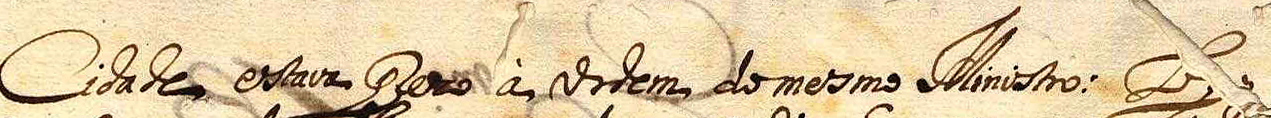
Cidade estava prezo a ordem do mesmo Ministro: Logo
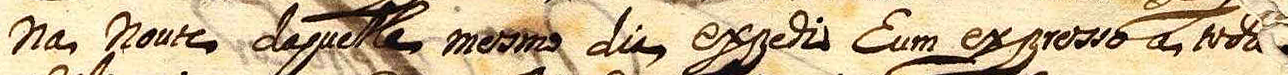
na noute daquelle mesmo dia expedio hum expresso a toda
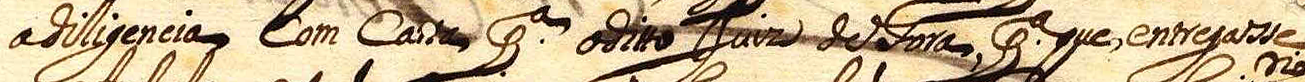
a diligencia com Carta p.a o ditto Juiz de Fora p.a que, entregasse
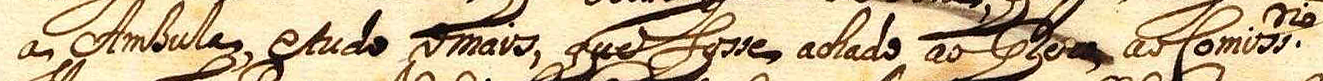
a Ambula, e tudo o mais, que fosse achado ao pRezo, ao Comiss.rio
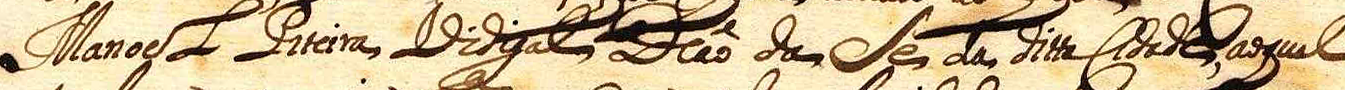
ManoeL Piteira Vidigal Deão da Sé da ditta Cidade, ao qual
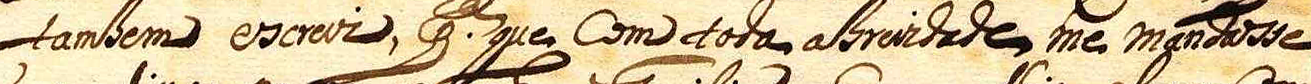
tambem escrevi, p.a que com toda a brevidade me mandasse
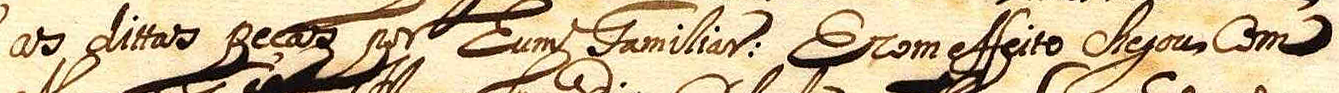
as dittas peças por hum Familiar: E com effeito chegou Com
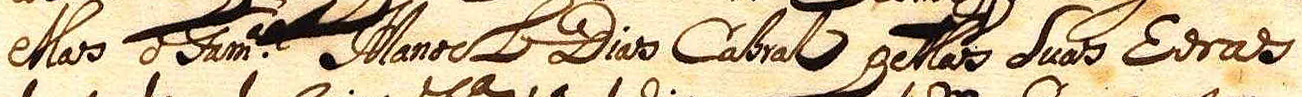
ellas o Fam.ar Manoel Dias Cabral pellas duas horas
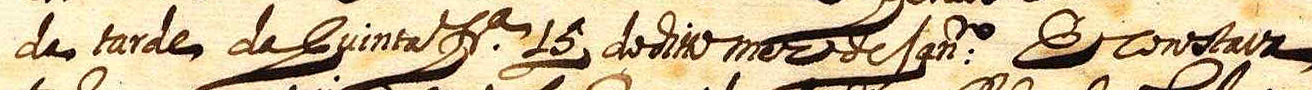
da tarde da quinta fr.a 15 do ditto mez de Jan:ro E constava
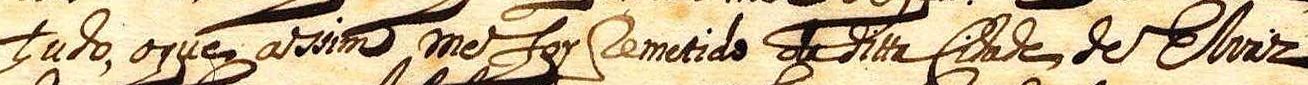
tudo, o que assim me foy Remetido da ditta Cidade de Elvaz
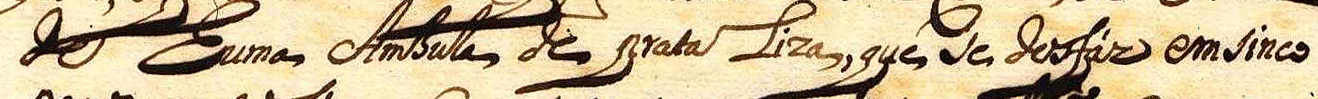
de huma Ambula de prata Liza, que se desfáz em sinco
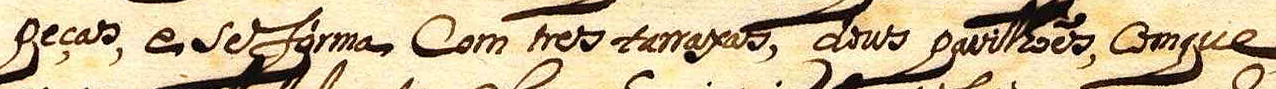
peças, e se forma com tres tarraxas, dous pavilhoẽs, com que
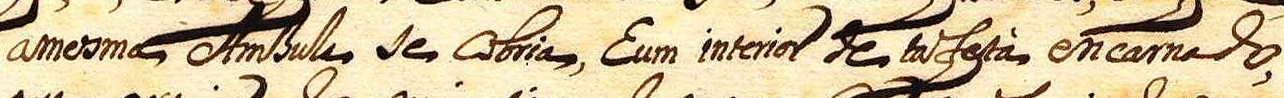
a mesma Ambula se cobria, hum interior de tafetà encarnado,
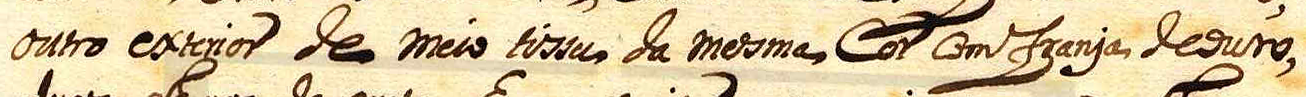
outro exterior de meio tissu da mesma Cor com franja de ouro,
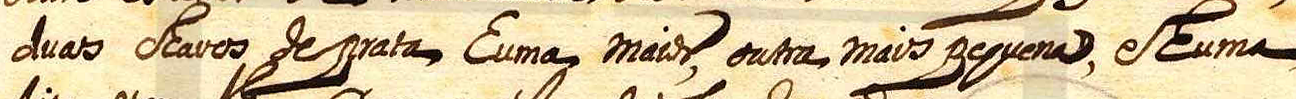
duas chaves de prata huma maior, outra mais pequena, e huma
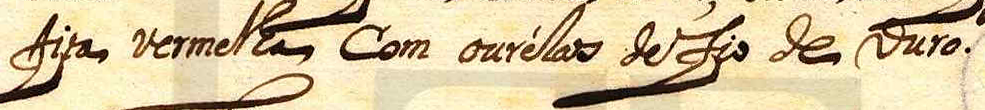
fita vermelha com ourélas de fio de Ouro.
